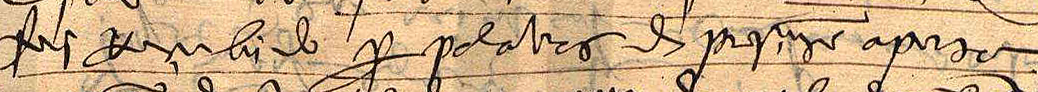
foj Reçebido ꝑ palavras de presēte a porta
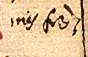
ines frz̄
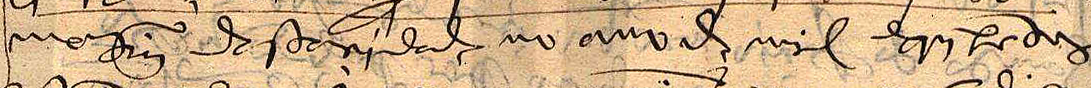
matriz desta çjdade no ano de mil e qujhētos
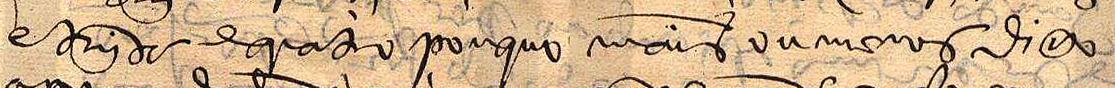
e trj̄ta e quatro pouquo m̄ais ou menos digo
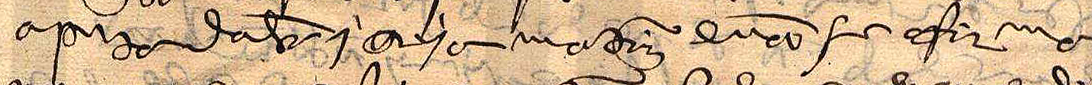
a porta da ħa jgreja matriz e não se afirma
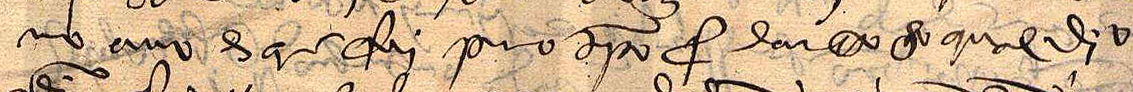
no ano e que foj pro tp̄o ꞩ largo ho qual djo
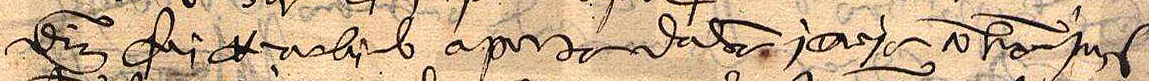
d̄iz foj Reçebido a porta da ħa jgreja c̄o hūa jnes
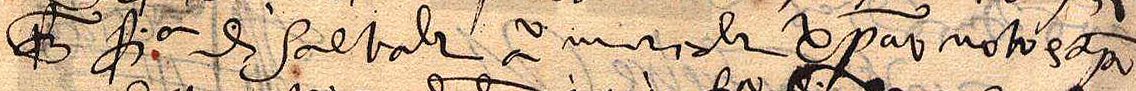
f̄rz fia de Salvador ao morador xpão novos e t̄po
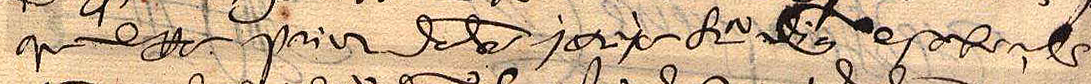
que eRa prior da ħa jgreja frco d̄iaz e sabe ele
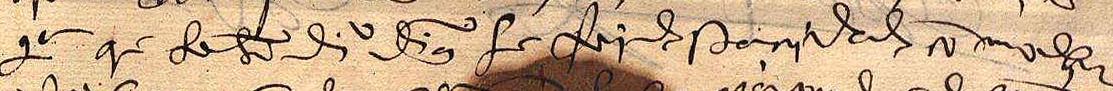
ta que ho ħo dio d̄ias se foy desta çidade cō molher
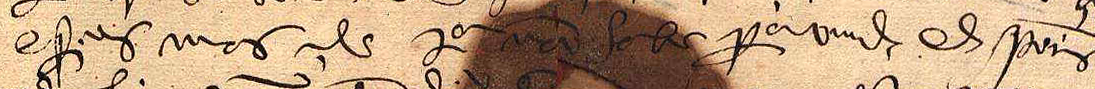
e fias mas ele ta naõ sabe ꝑa vmde e despois
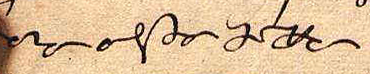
ora a esta teRa
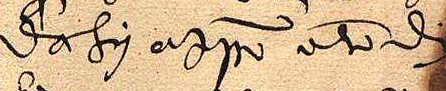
dahy a tp̄o o d̄to di
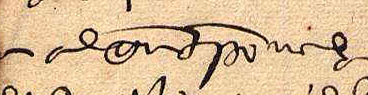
algū tp̄o nele
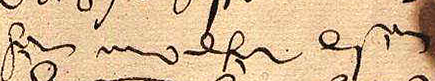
ser molher e sem
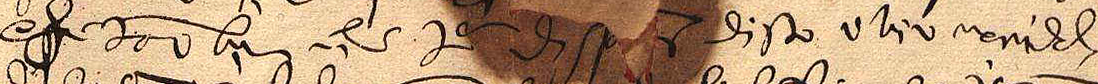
e he tãobem ele ta desp_s disto o veo na çidade
